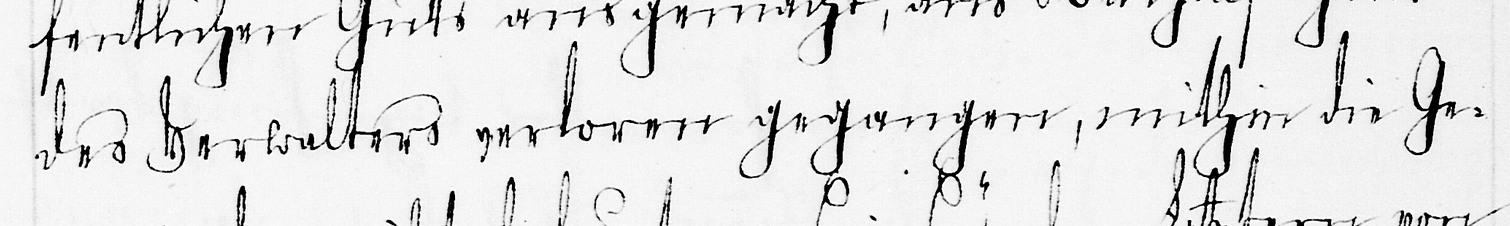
des Verwalters verloren gegangen, mithin die Ge¬
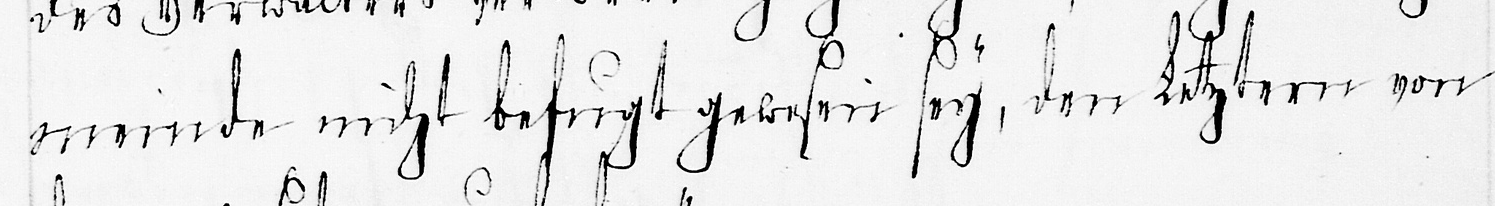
meinde nicht befugt gewesen sey, den Letztern von
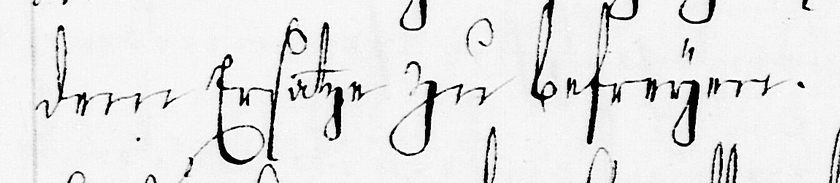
dem Ersatze zu befreyen.
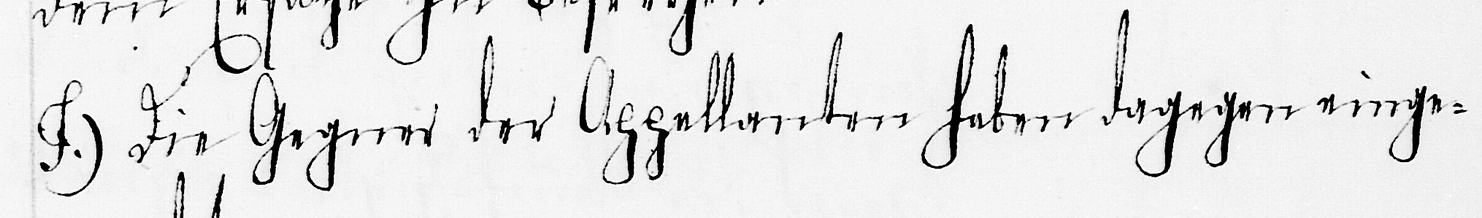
F.) Die Gegner der Appellanten haben dagegen einge¬
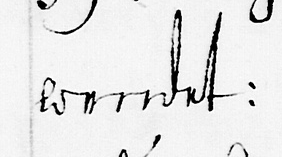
wendet:
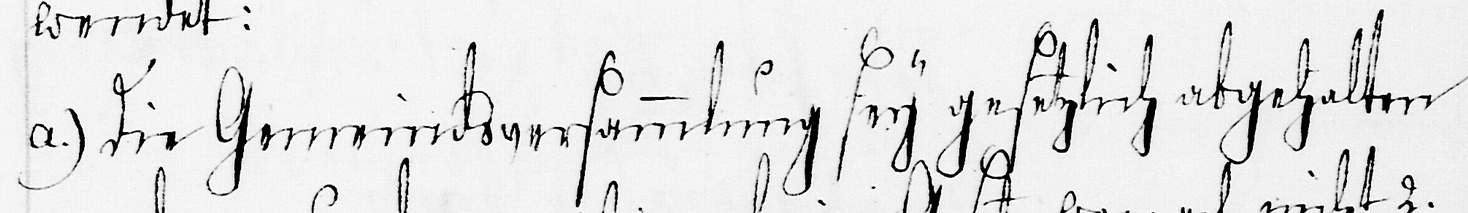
a.) Die Gemeindsversammlung sey gesetzlich abgehalten
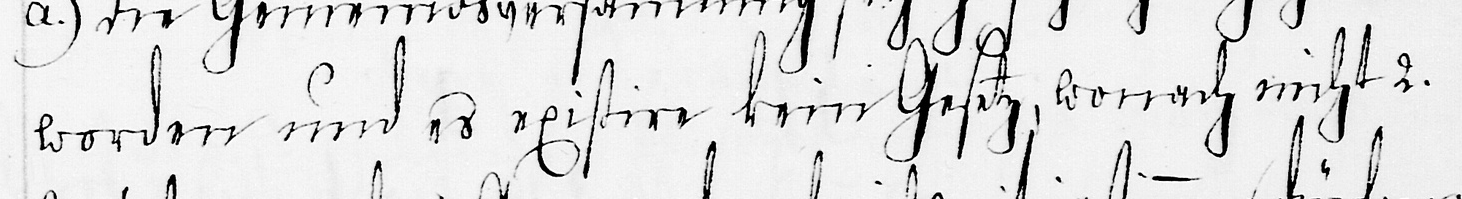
worden und es existire kein Gesetz, wonach nicht 2.
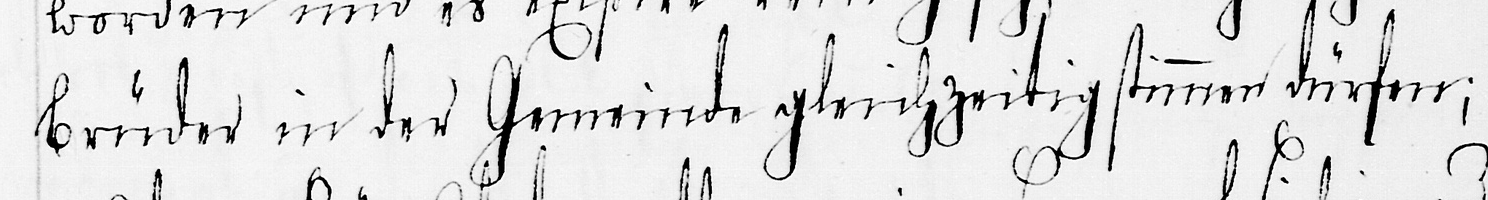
Brüder in der Gemeinde gleichzeitig stimmen dürfen;
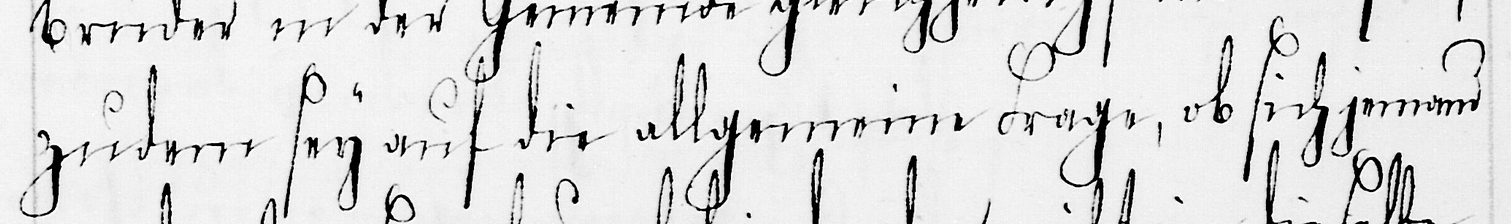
zudem sey auf die allgemeine Frage, ob sich jemand
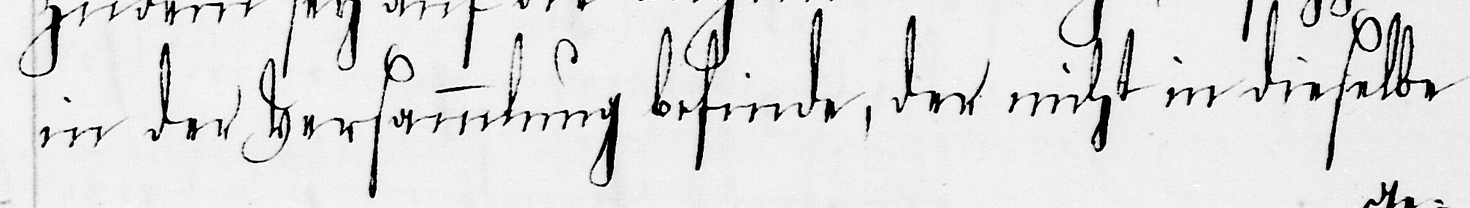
in der Versammlung befinde, der nicht in dieselbe
